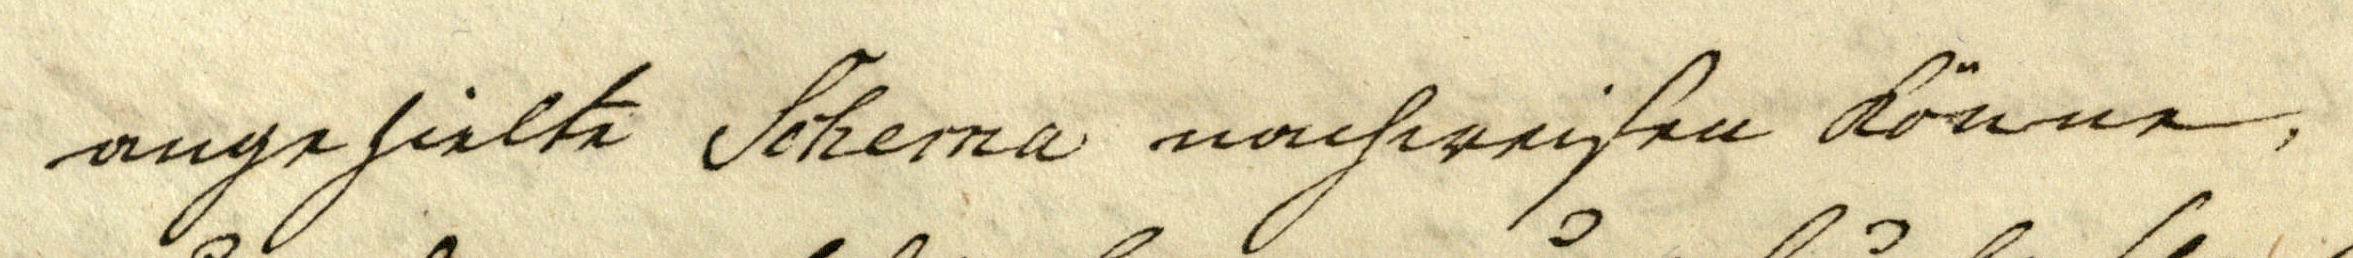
angezielte Schema nachweisen könne,
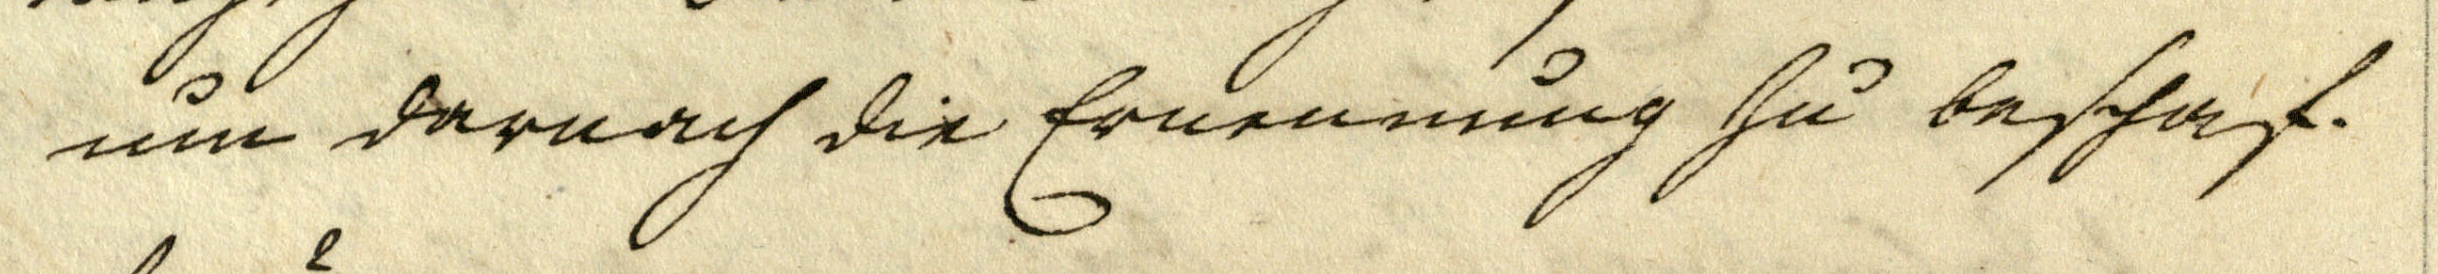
um darnach die Ernennung zu beschaf-
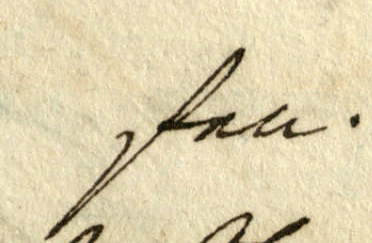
fen?
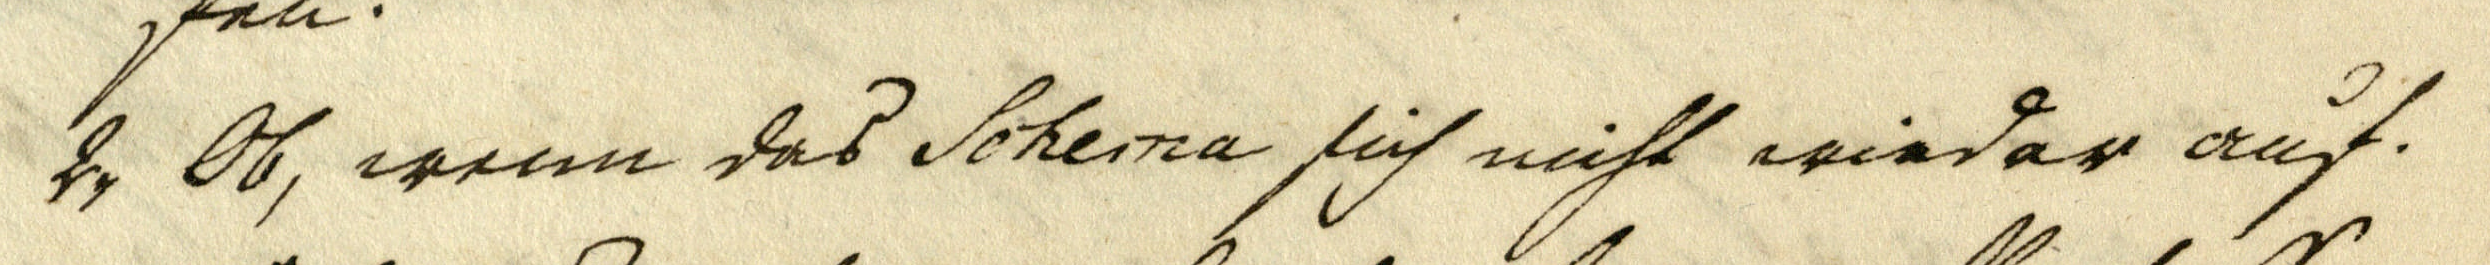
2. Ob, wenn das Schema sich nicht wieder auf-
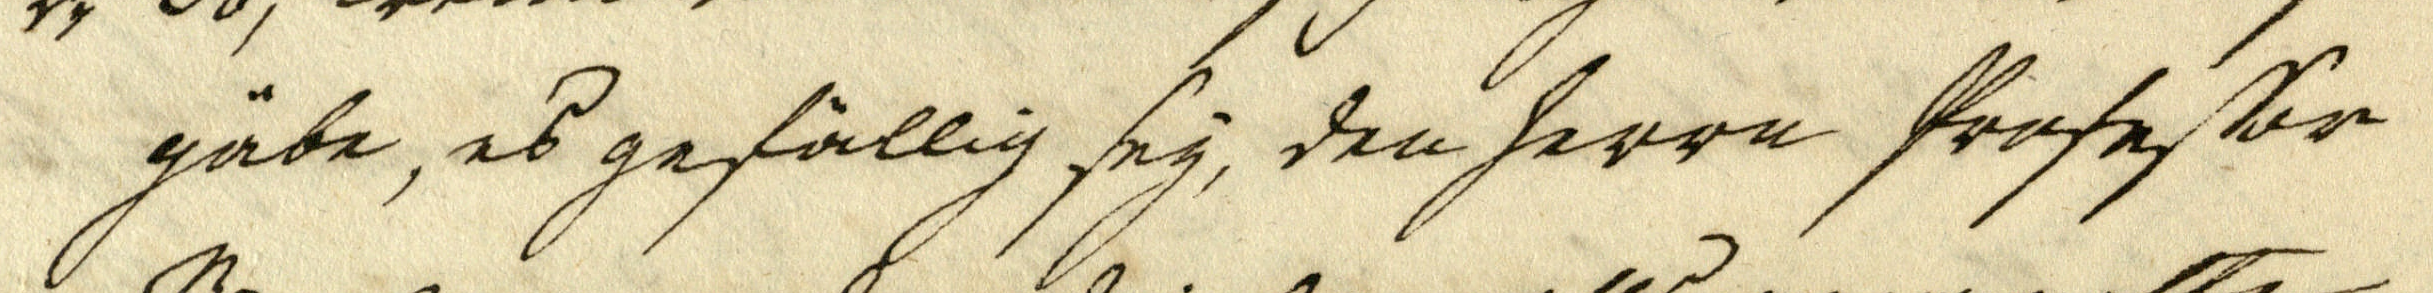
gäbe, es gefällig sey, den herrn Professor
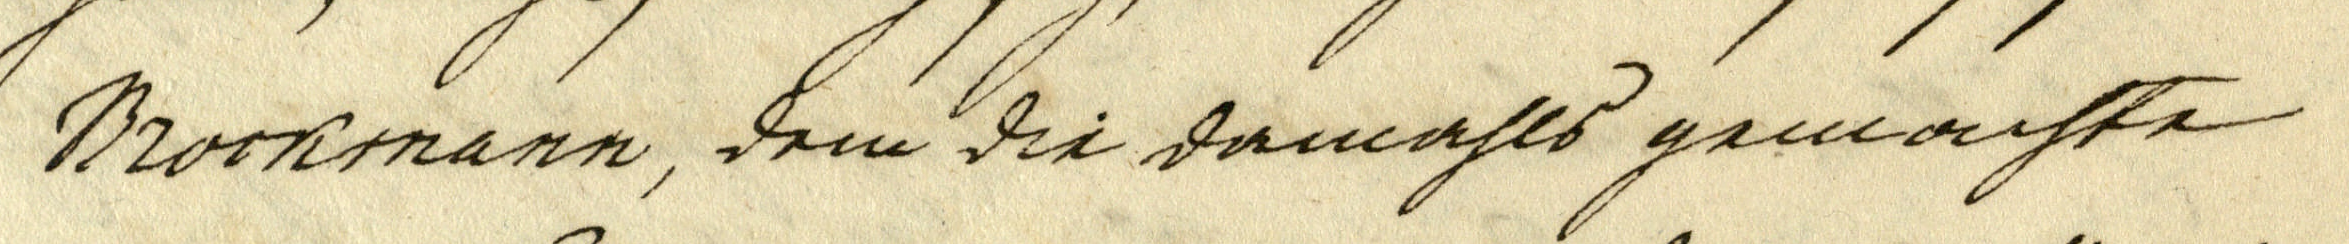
Brockmann, dem die damahls gemachte
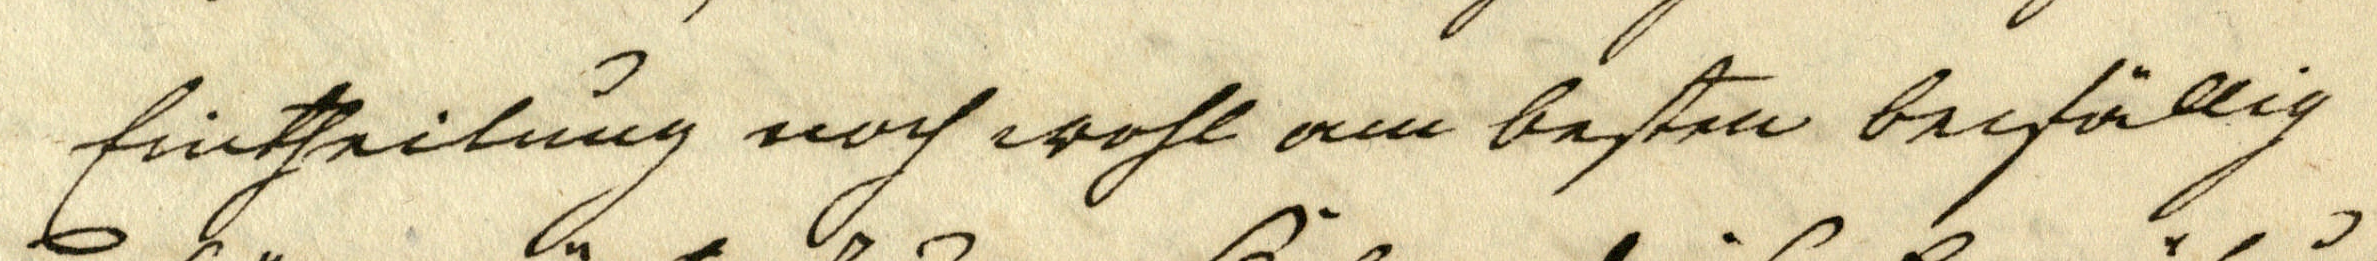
Eintheilung noch wohl am besten beifällig
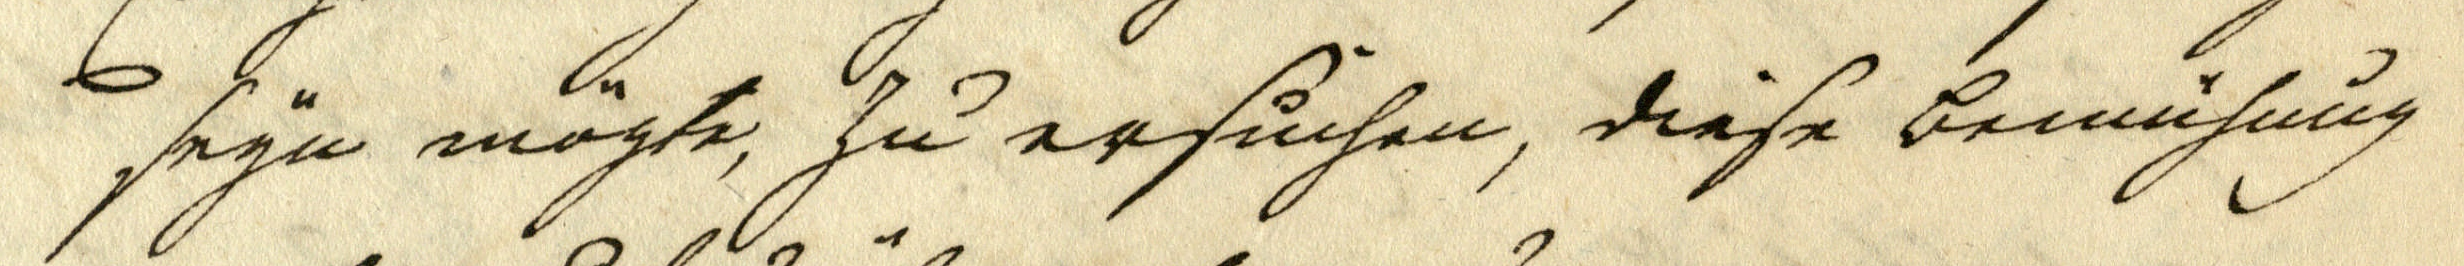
seyn mögte, zu ersuchen, diese Bemühung
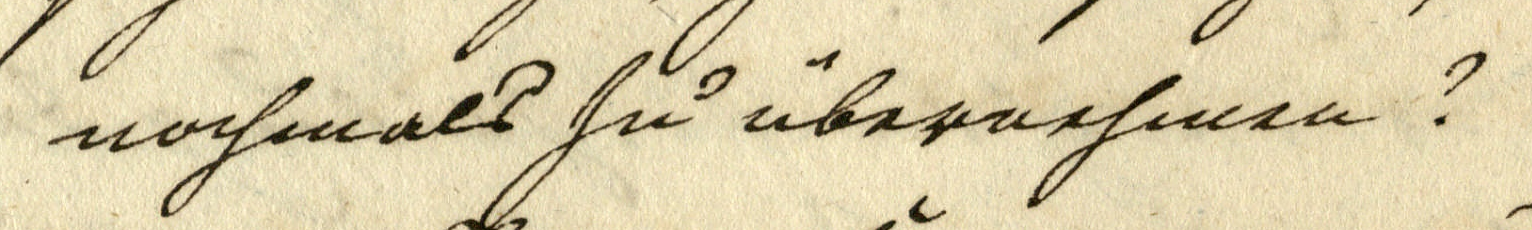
nochmals zu übernehmen?
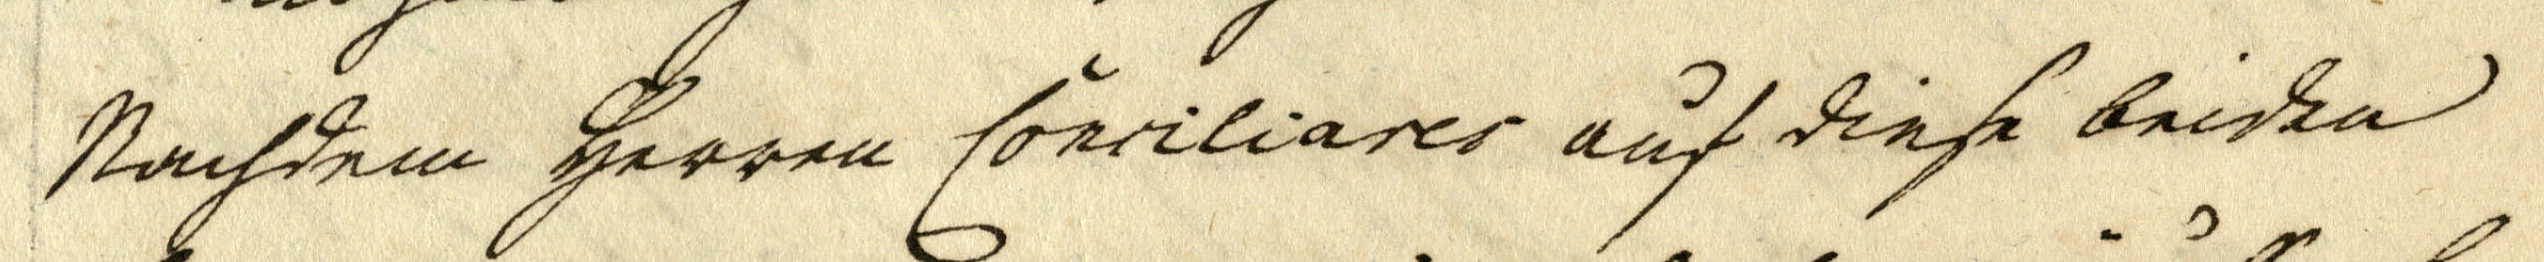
Nachdem Herren Conciliares auf diese beiden
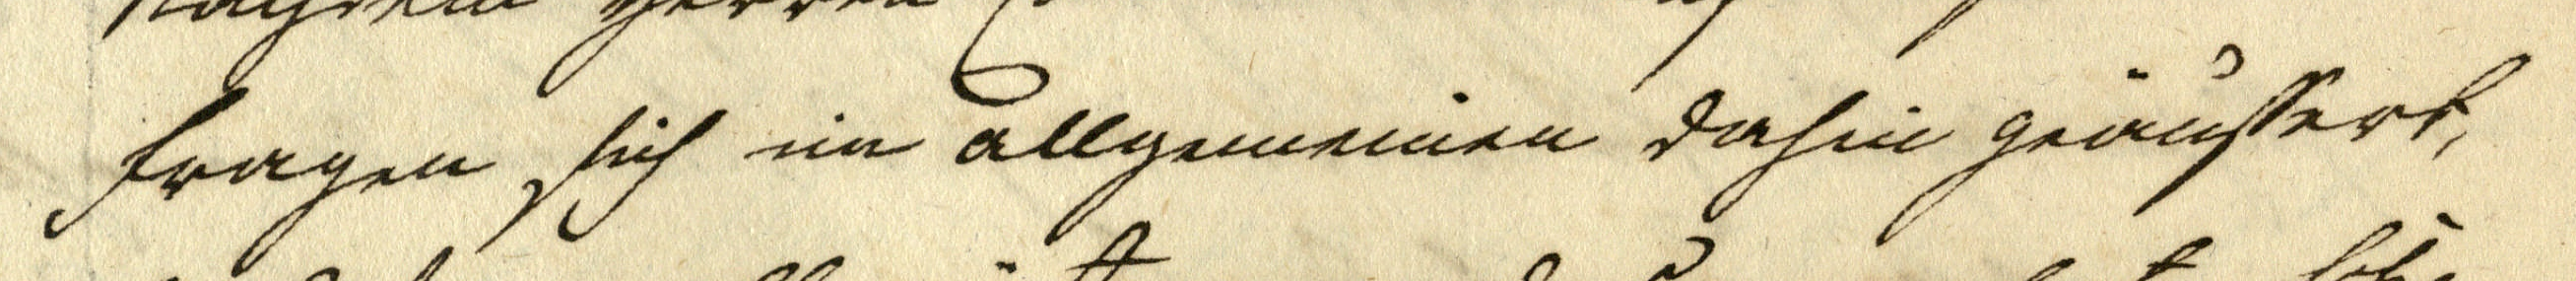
Fragen sich im allgemeinen dahin geäussert,
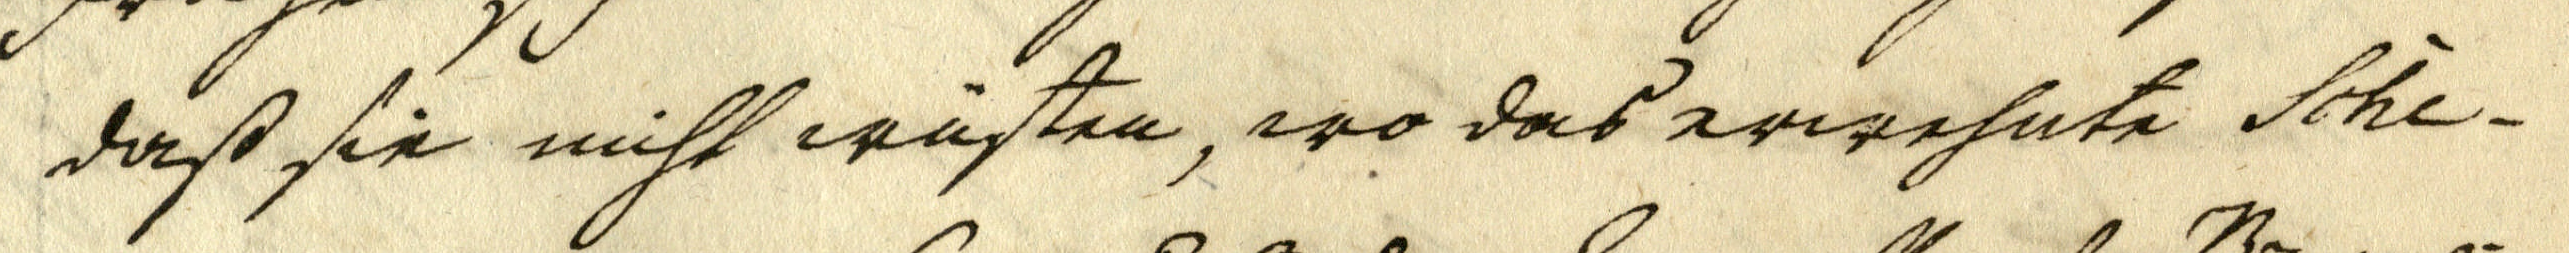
daß sie nicht wüßten, wo das erwehnte Sche-
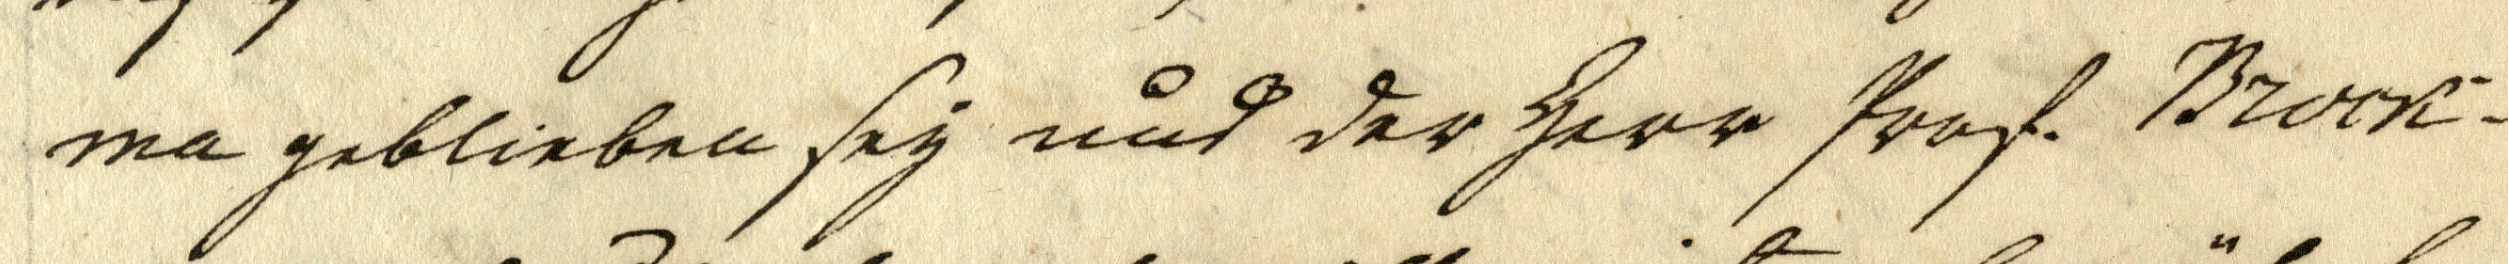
ma geblieben sey und der herr Prof. Brock-
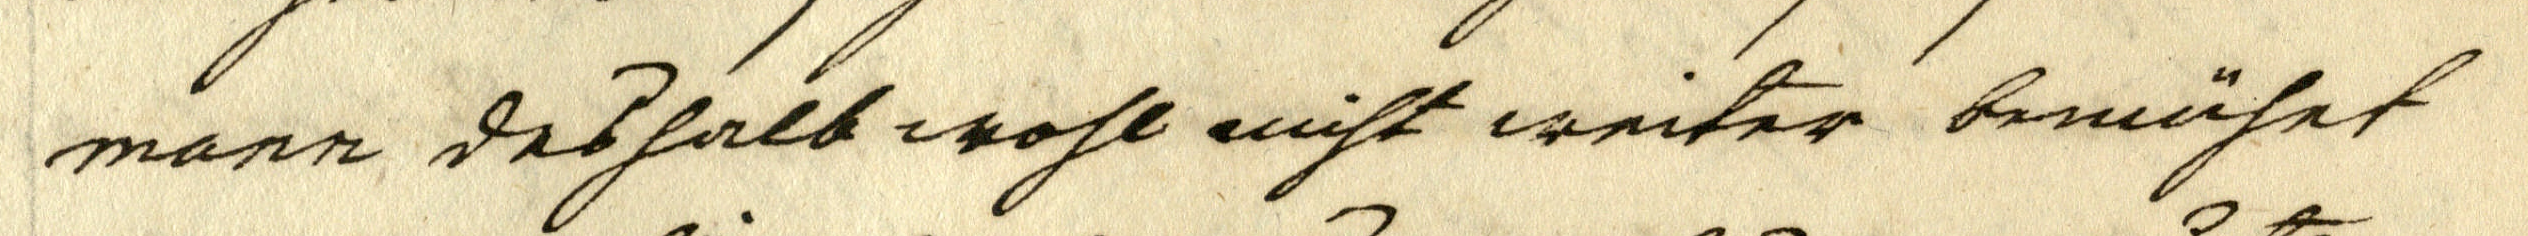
mann deshalb wohl nicht weiter bemühet
